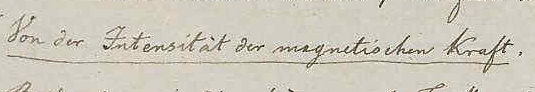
Von der Intensität der magnetischen Kraft.
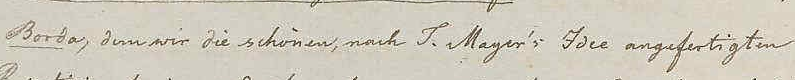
Borda, dem wir die schönen, nach T. Mayer's Idee angefertigten
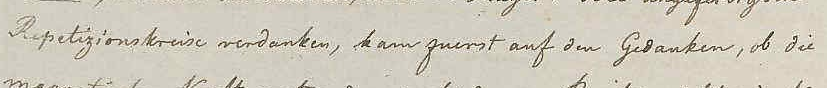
Repetizionskreise verdanken, kam zuerst auf den Gedanken, ob die
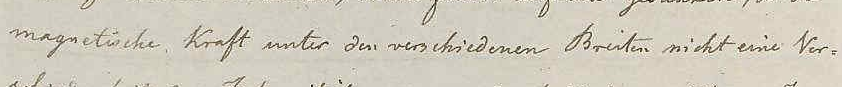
magnetische Kraft unter den verschiedenen Breiten nicht eine Ver-
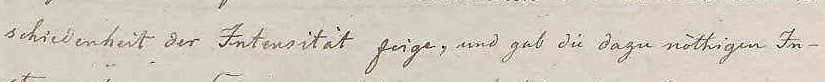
schiedenheit der Intensität zeige, und gab die dazu nöthigen In-
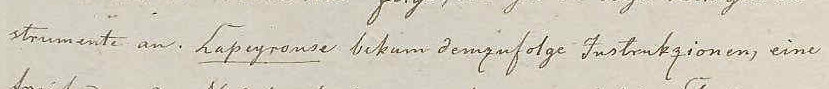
strumente an. Lapeyrouse bekam demzufolge Instrukzionen, eine
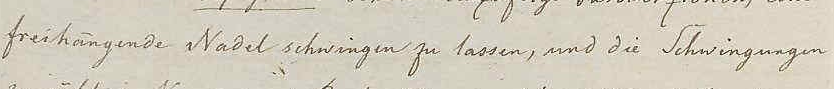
freihängende Nadel schwingen zu lassen, und die Schwingungen
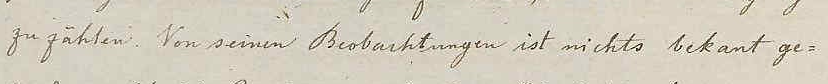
zu zählen. Von seinen Beobachtungen ist nichts bekant ge-
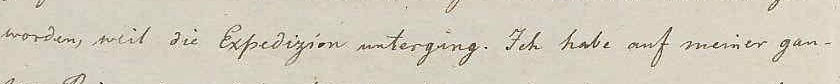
worden, weil die Expedizion unterging. Ich habe auf meiner gan-
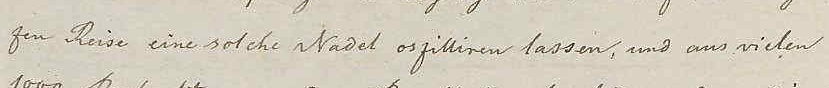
zen Reise eine solche Nadel oszilliren lassen, und aus vielen
